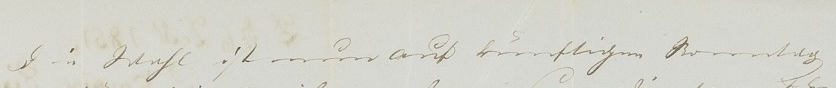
Die Wahl ist nun auf künftigen Sonntag
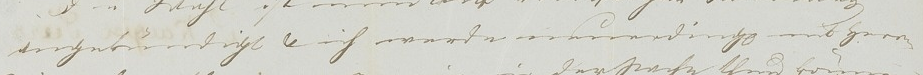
angekündigt & ich werde neuerdings mit Herrn
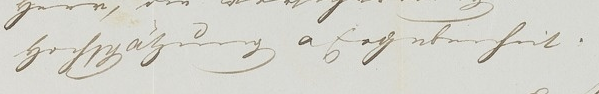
Hochschätzung & Ergebenheit.
